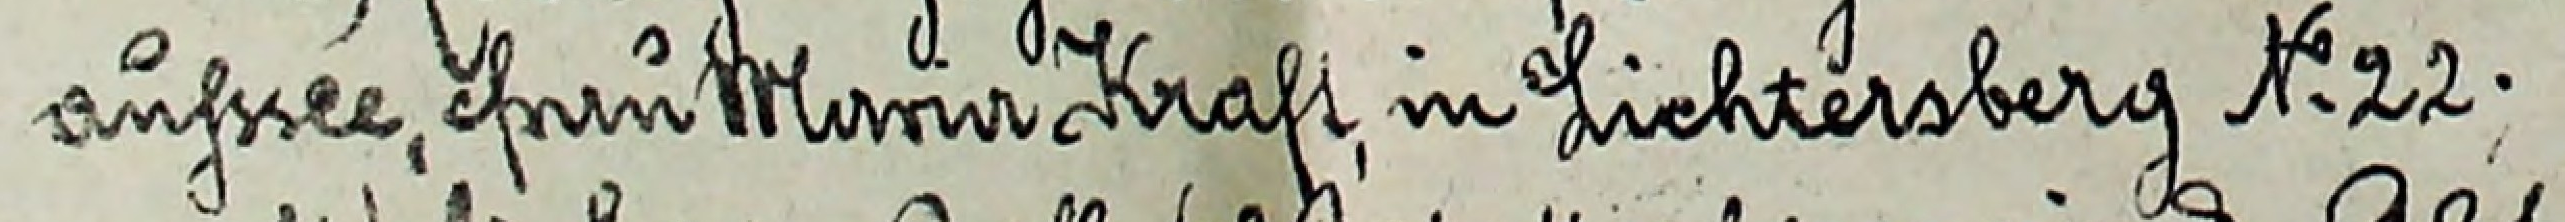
aussee, Frau Maria Kraft, in Lichtersberg No 22;
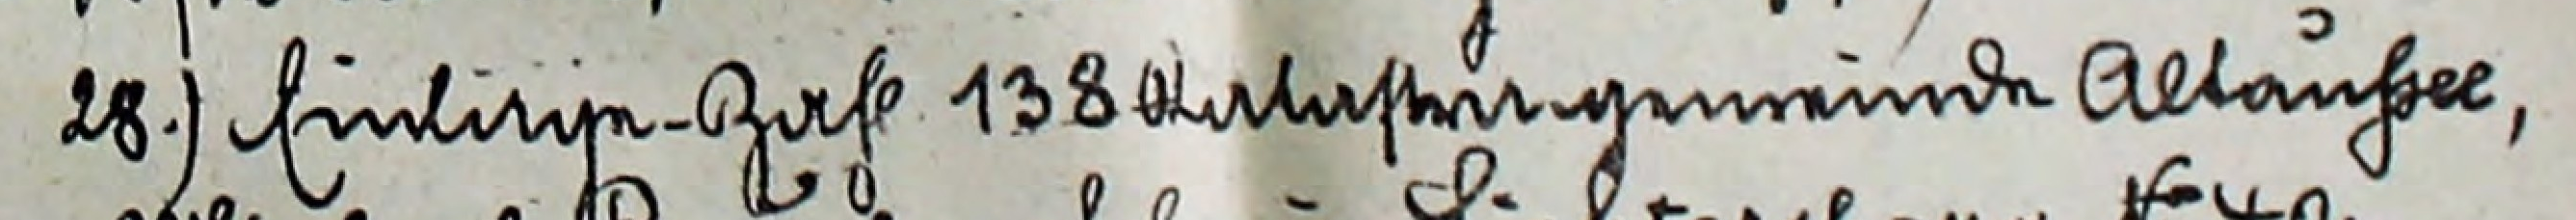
28.) Einlage - Zahl 138 Katastralgemeinde Altaussee,
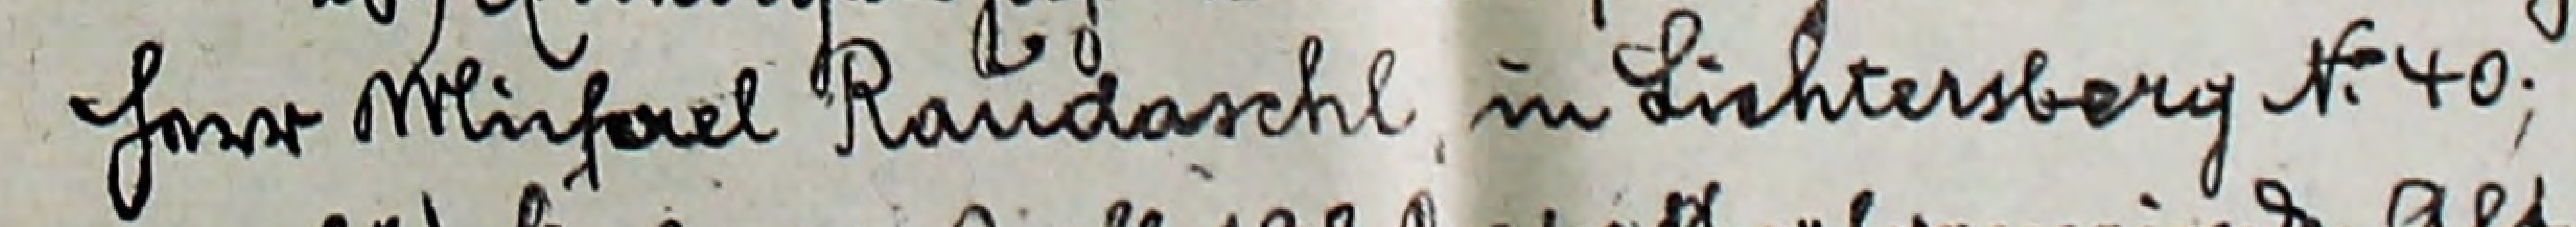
Herr Michael Raudaschl, in Lichtersberg No 40;
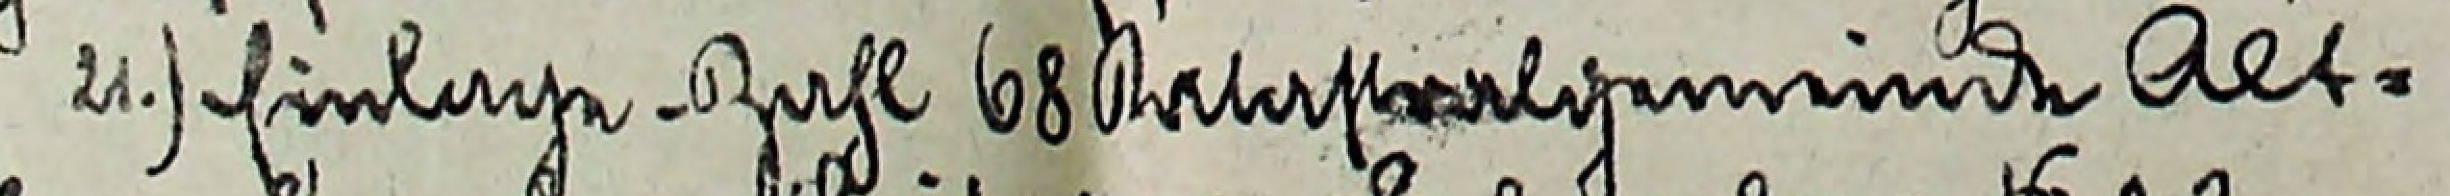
21.) Einlage - Zahl 68 Katastralgemeinde Alt=
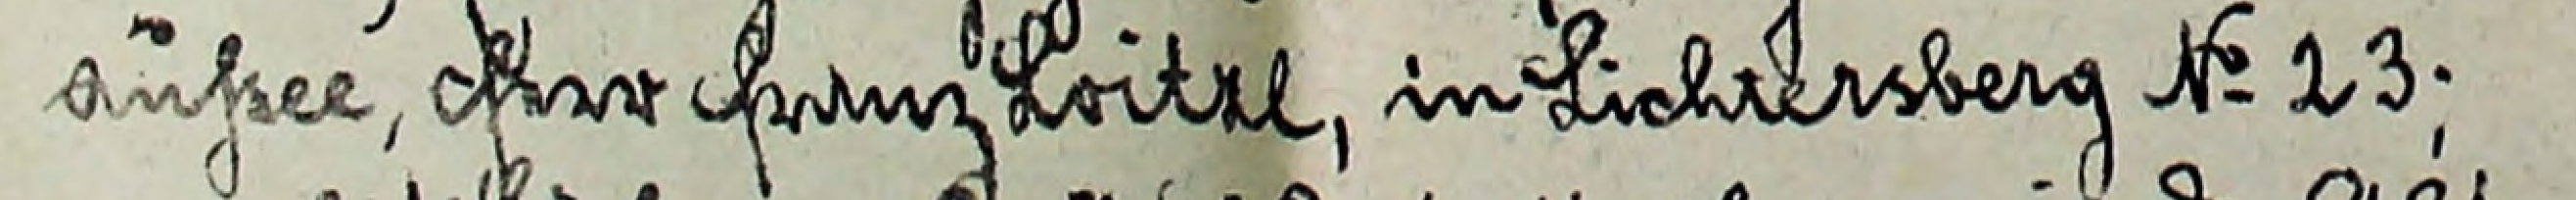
aussee, Herr Franz Loitzl, in Lichtersberg No 23;
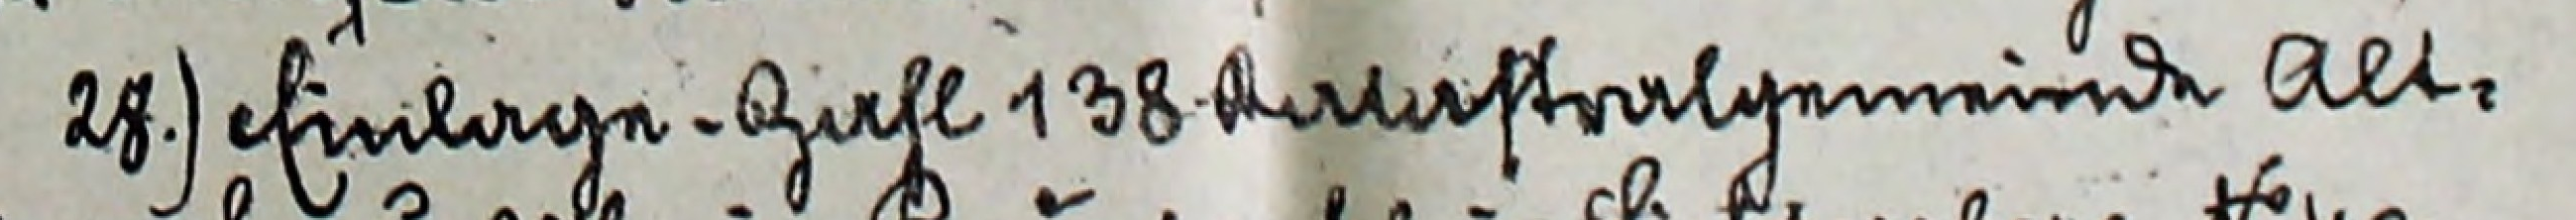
28.) Einlage - Zahl 138 Katastralgemeinde Alt=
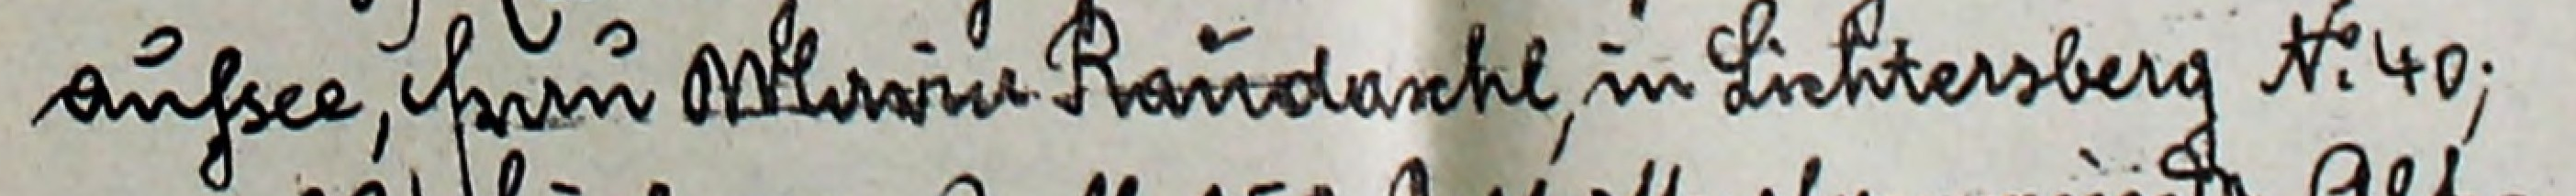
aussee, Frau Maria Raudaschl, in Lichtersberg No 40;
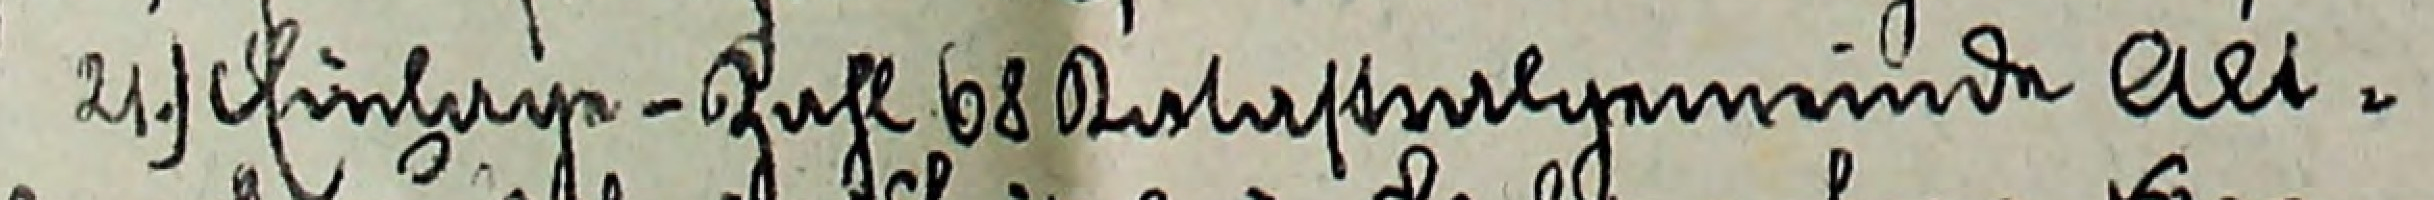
21.) Einlage - Zahl 68 Katastralgemeinde Alt=
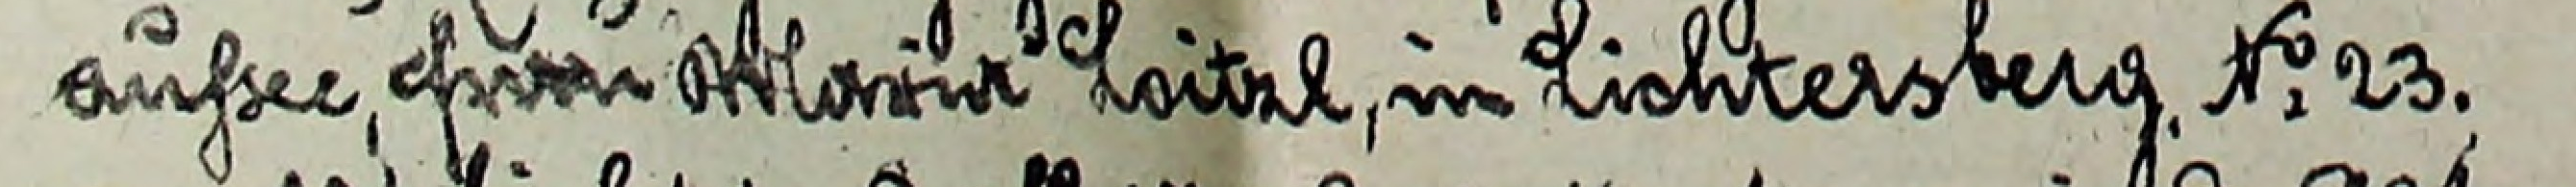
aussee, Frau Maria Loitzl, in Lichtersberg, No 23.
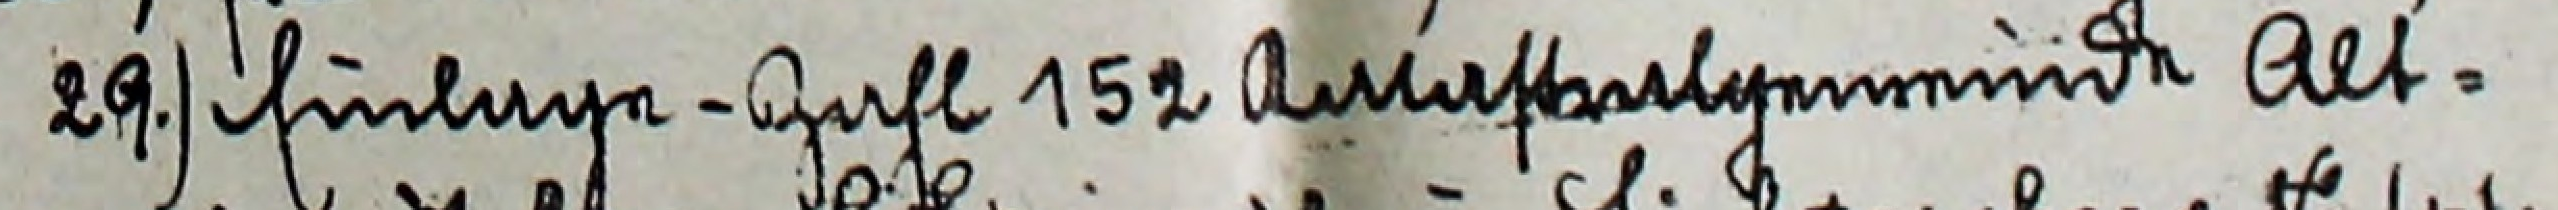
29.) Einlage - Zahl 152 Katastralgemeinde Alt=
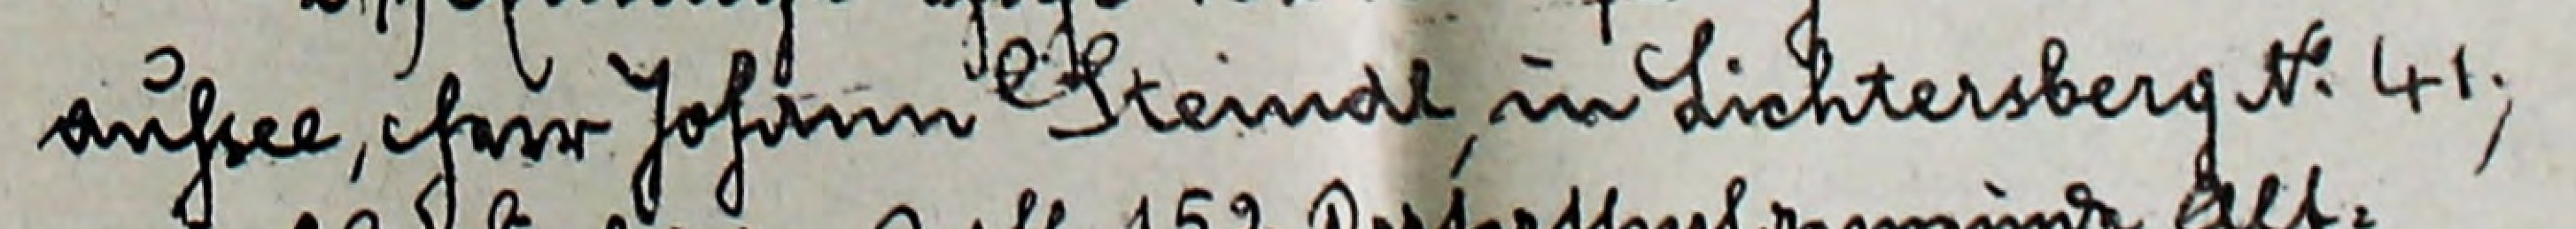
aussee, Herr Johann Steindl, in Lichtersberg No 41;
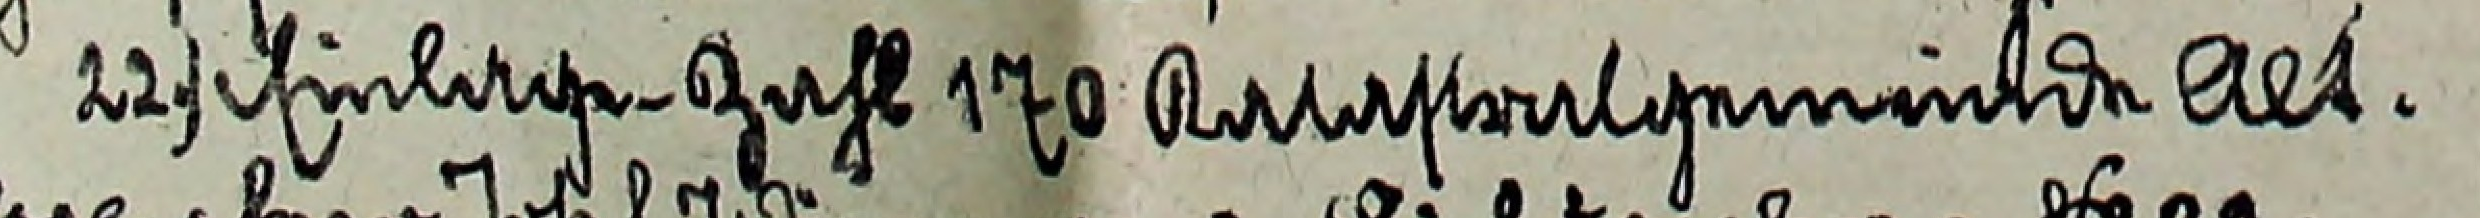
22.) Einlage - Zahl 170 Katastralgemeinde Alt=
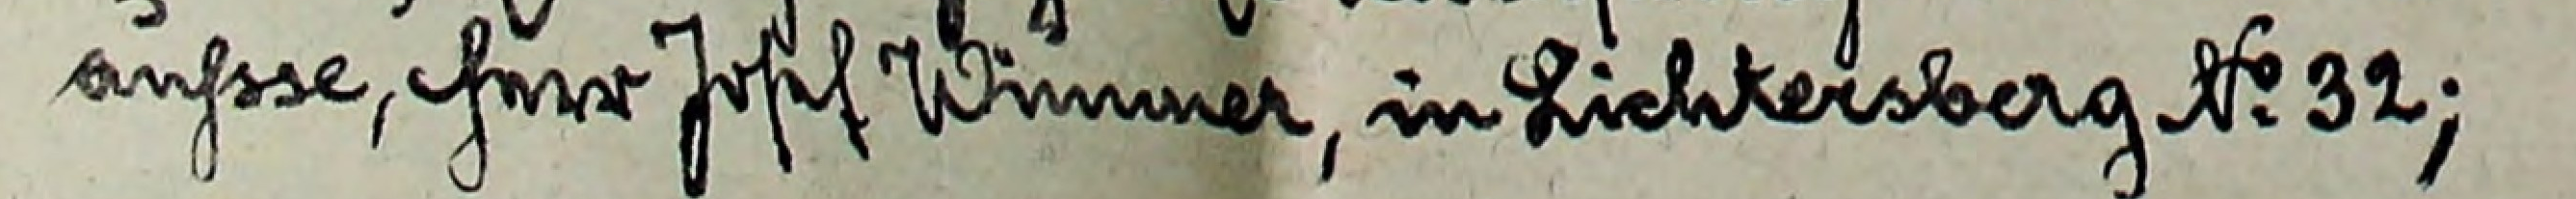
ausse, Herr Josef Wimmer, in Lichtersberg No 32;
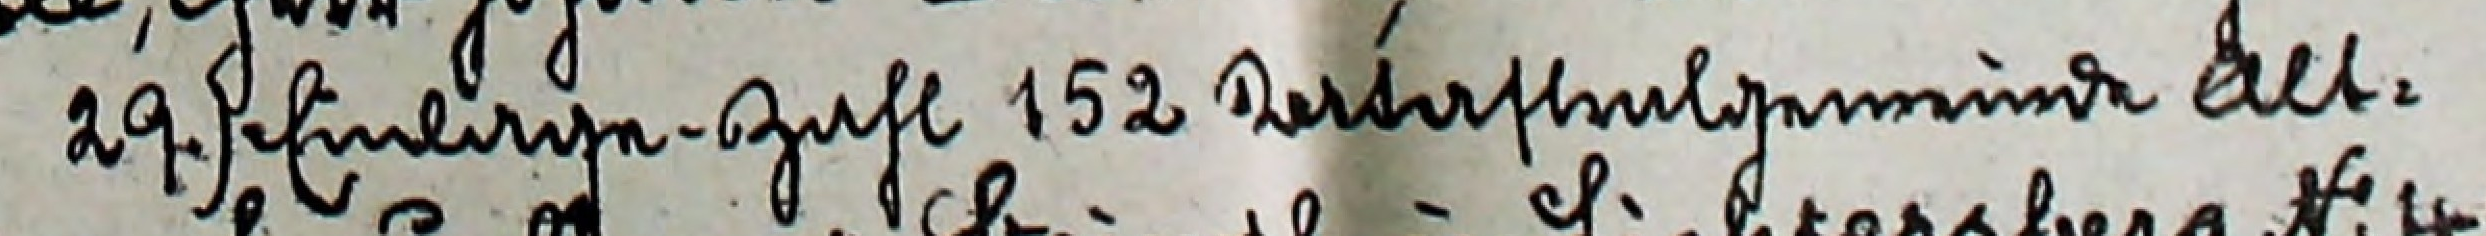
29.) Einlage - Zahl 152 Katastralgemeinde Alt=
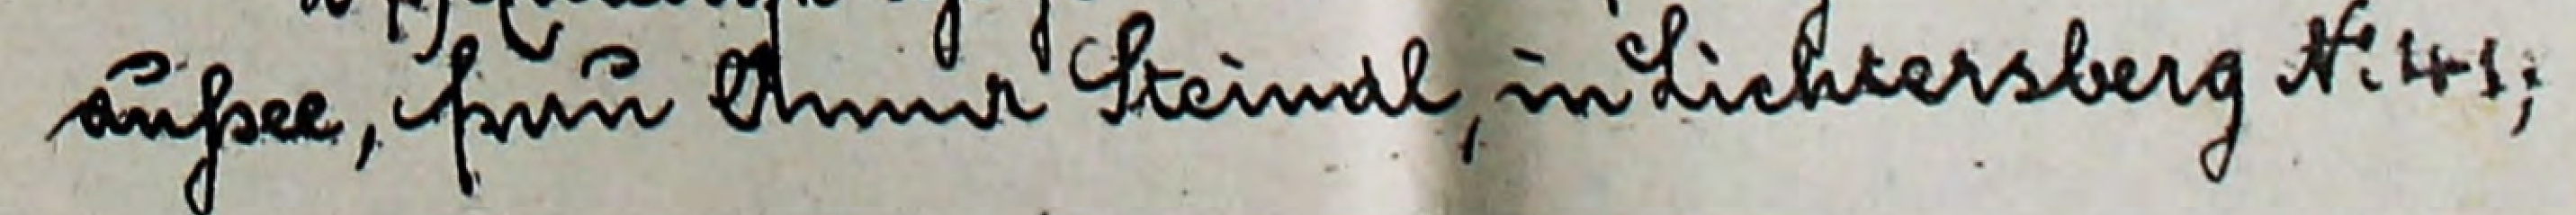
aussee, Frau Anna Steindl, in Lichtersberg No 41;
